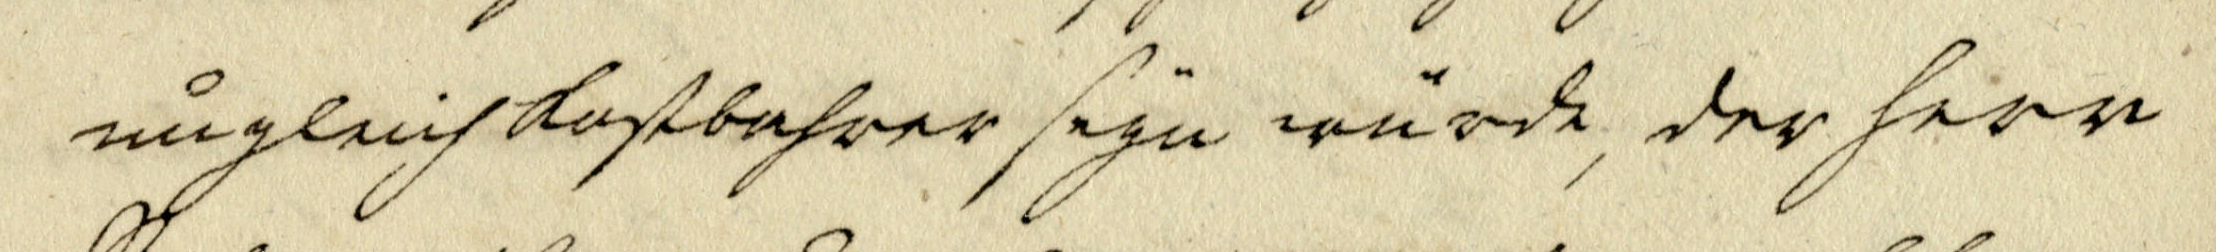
ungleich kostbahrer seÿn würde, der Herr
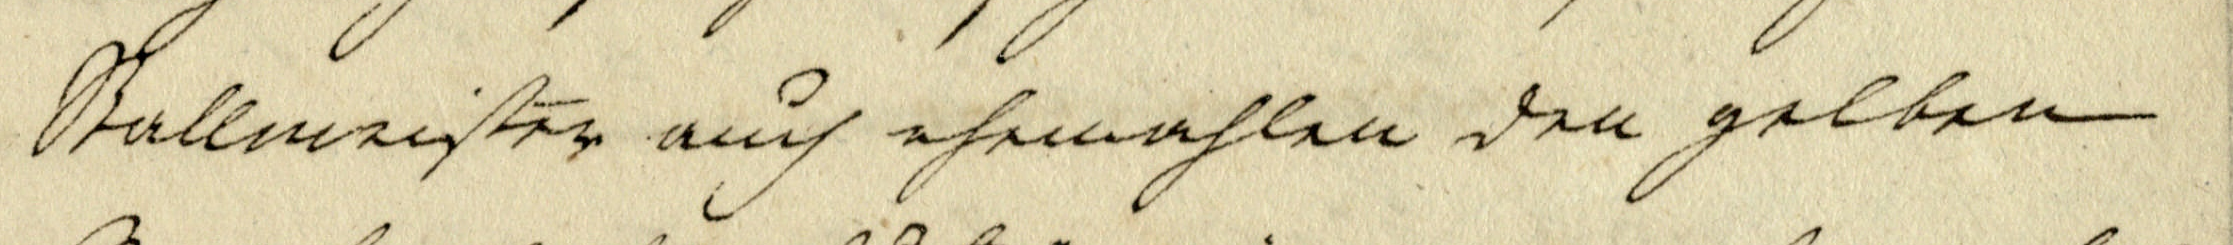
Stallmeister auch ehemahlen den gelben
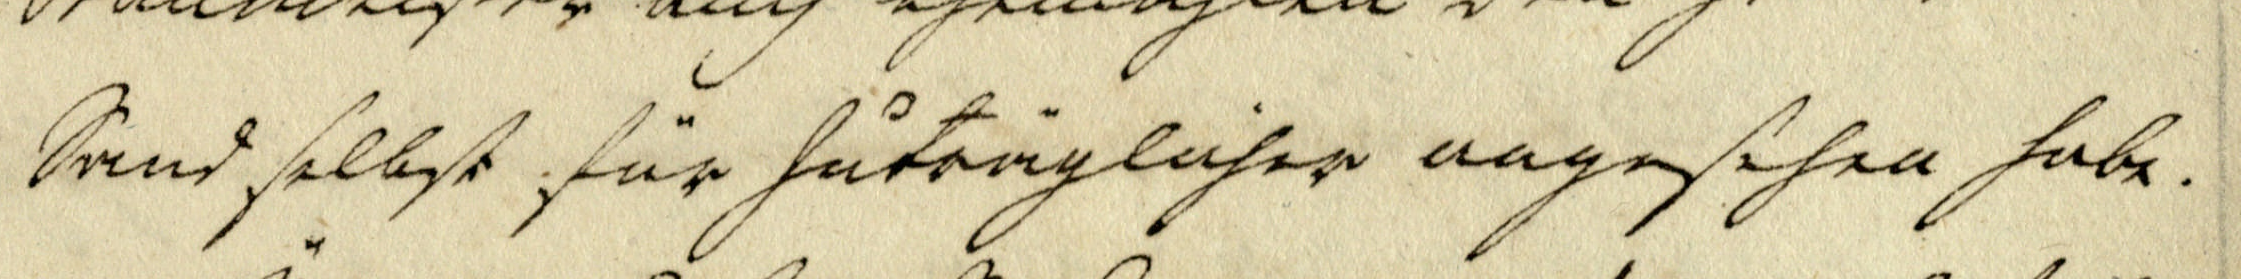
Sand selbst für zuträglicher angesehen habe.
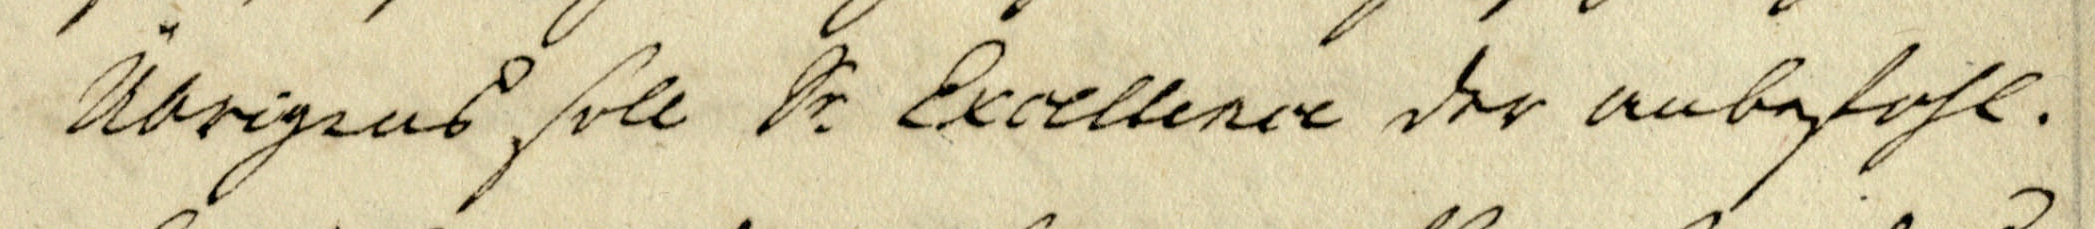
Übrigens soll Sr Excellence der anbefohl¬
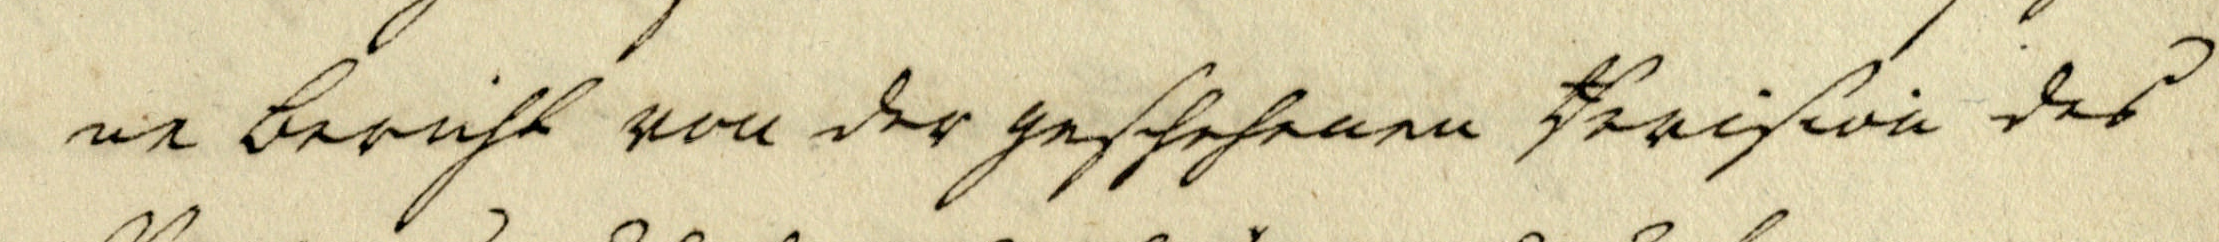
ne Bericht von der geschehenen Revision des
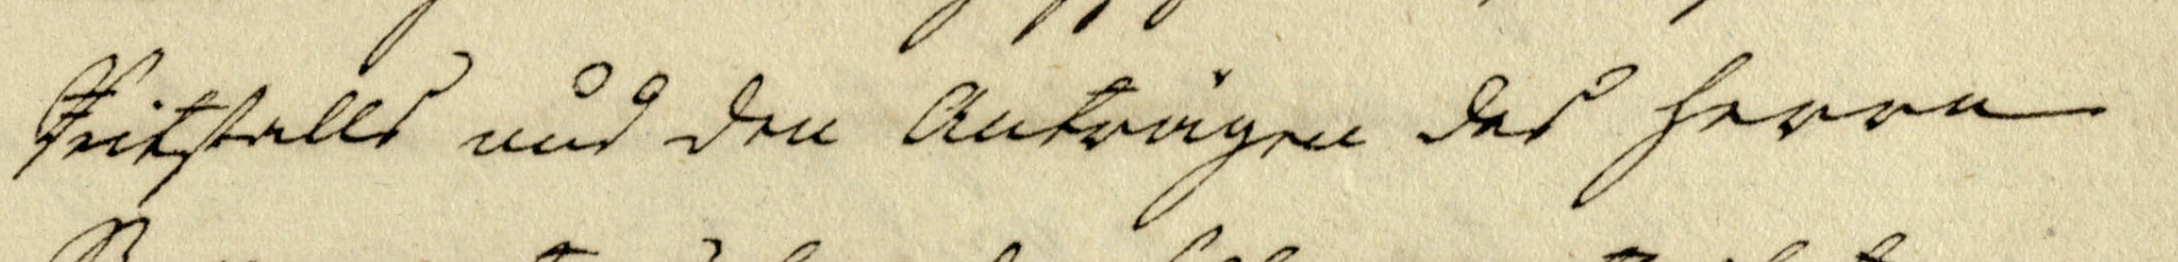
Reitstalls und den Anträgen des Herrn
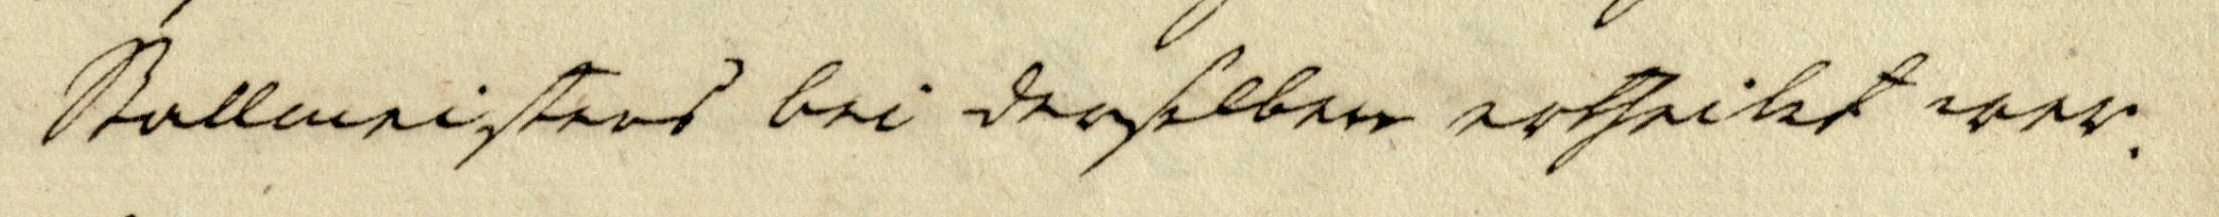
Stallmeisters bei derselben ertheilet wer¬
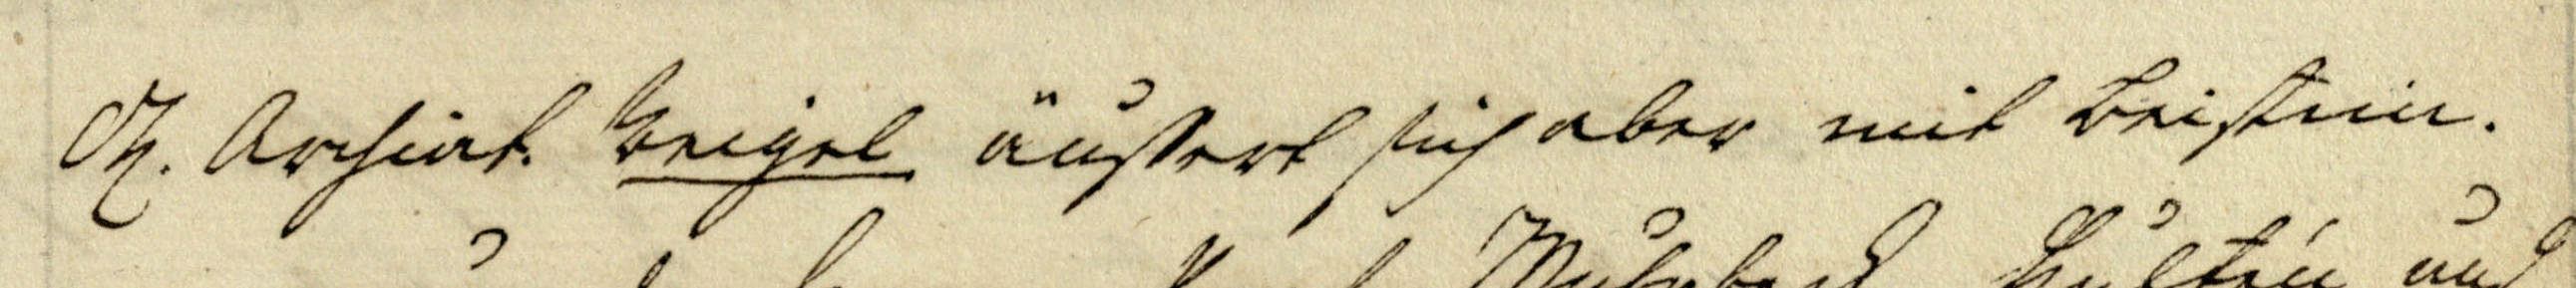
dh. Archiat. Weigel, äussert sich aber mit Beistim¬
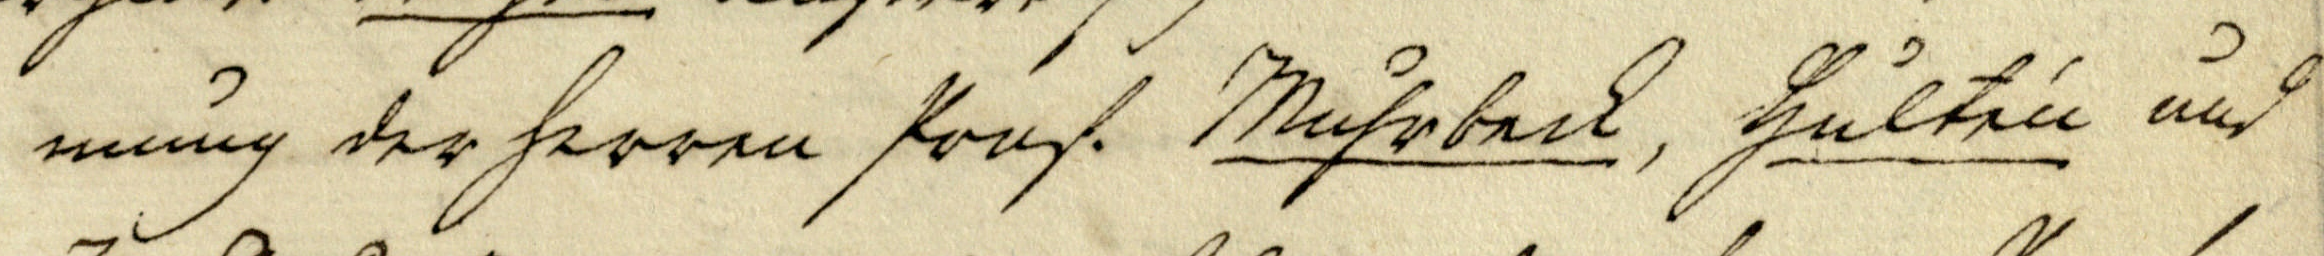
nung der Herren Prof. Muhrbeck, Hultén und
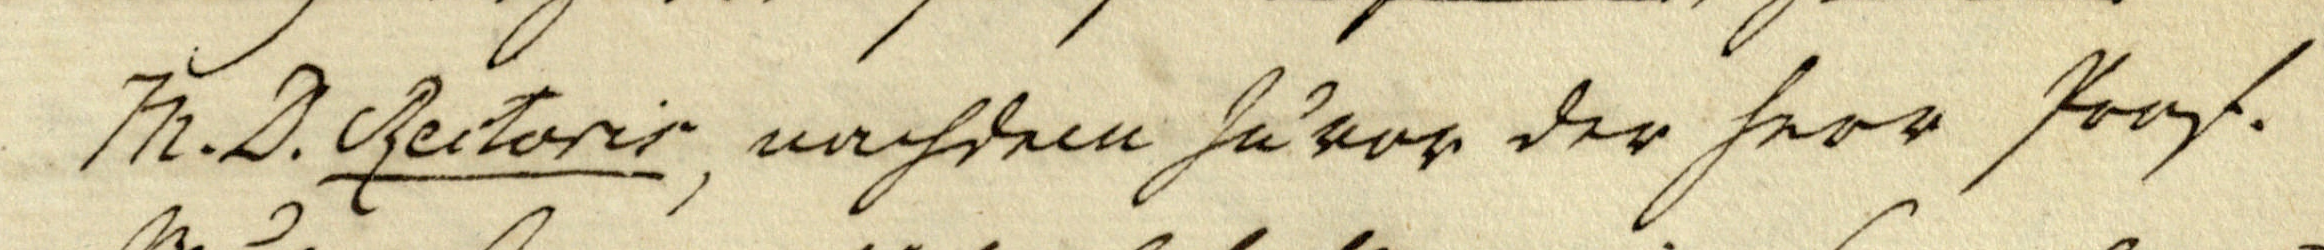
M. D. Rectoris, nachdem zuvor der Herr Prof.
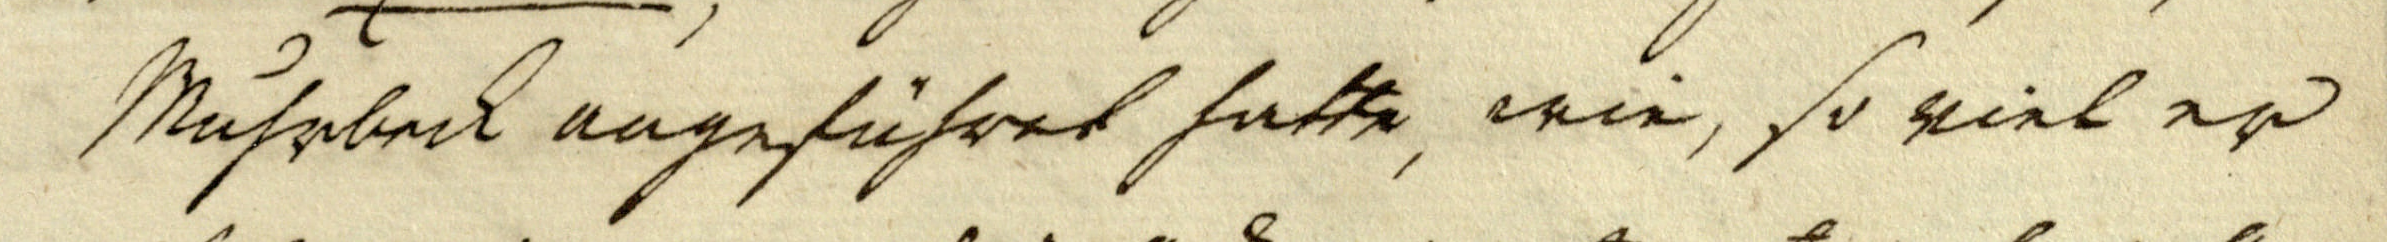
Muhrbeck angeführet hatte, wie, so viel er
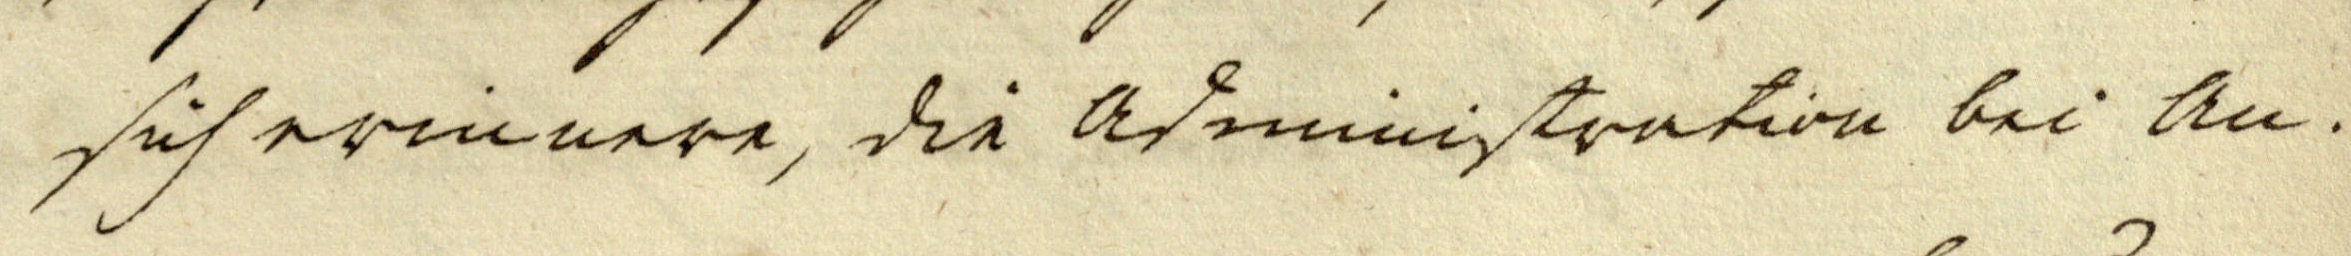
sich erinnere, die Administration bei An
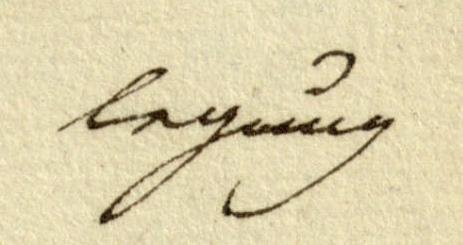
legung
